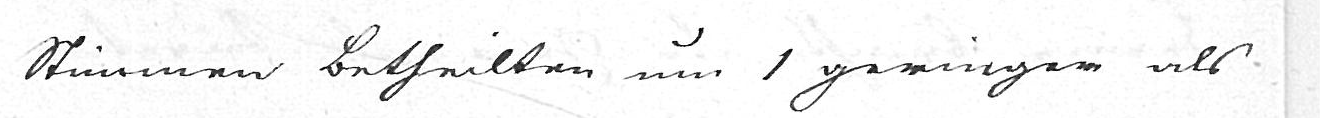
Stimmen Betheilten um 1 geringer als
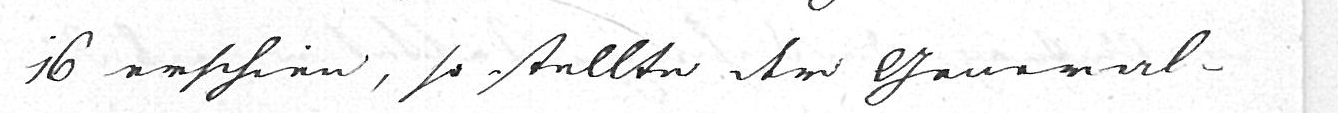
16 erschien, so stellt der General-
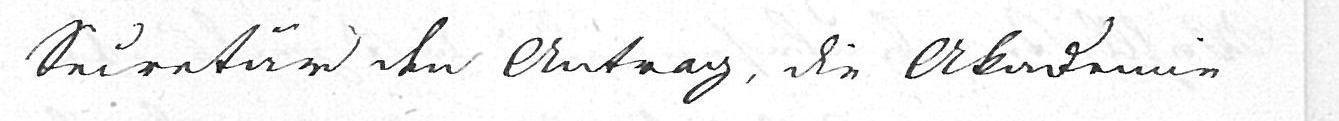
Secretär den Antrag, die Akademie
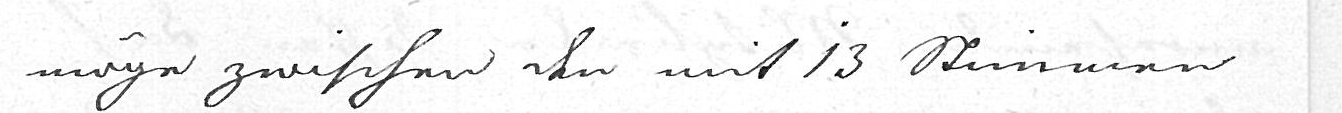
möge zwischen den mit 13 Stimmen
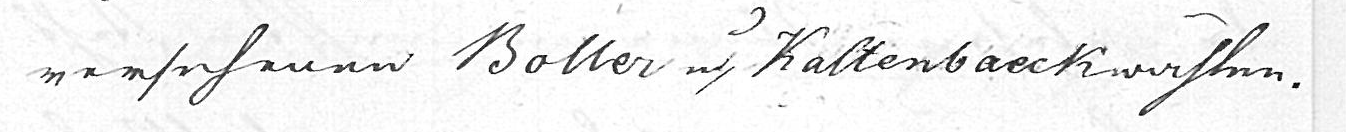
versehenen Boller und Kaltenbaeck wählen.
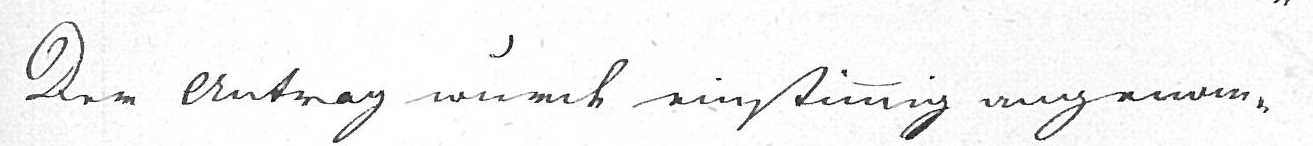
Der Antrag wurde einstimmig angenom-
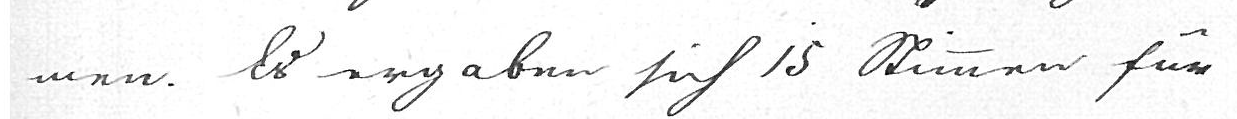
men. Es ergaben sich 15 Stimmen für
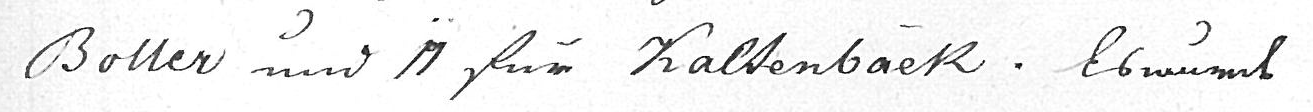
Boller und 11 für Kaltenbaek. Es wurde
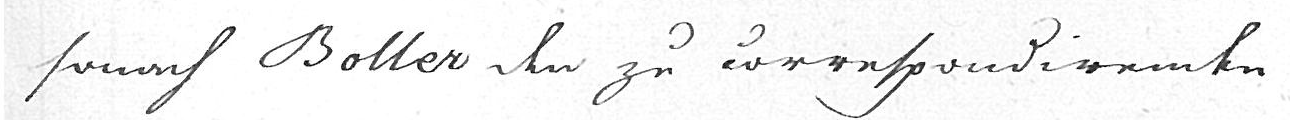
sonach Boller den zu conrrespondirenden
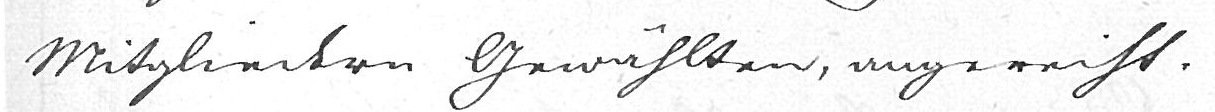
Mitgliedern Gewählten, angereiht.
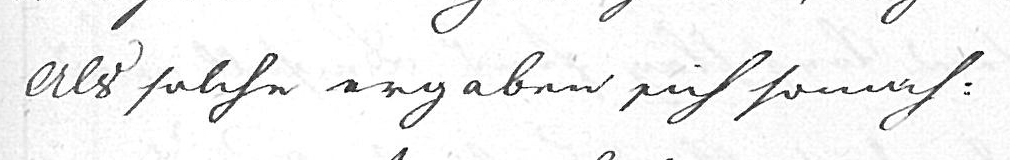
Als solche ergaben sich sonach:
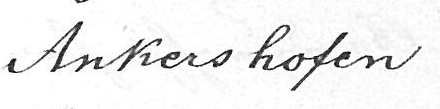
Ankershofen
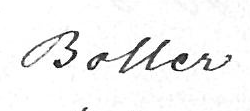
Boller
